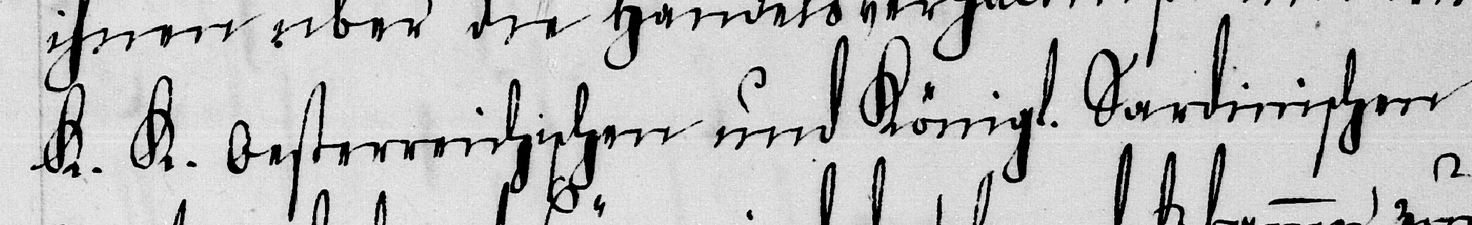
K. K. Oesterreichischen und Königl. Sardinischen
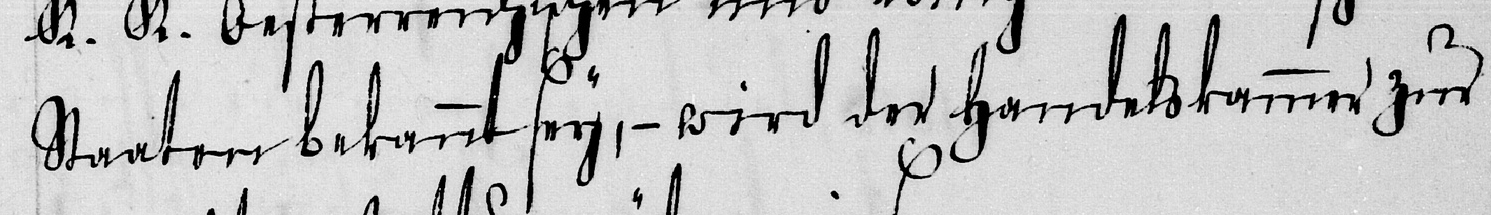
Staaten bekannt sey, – wird der Handelskammer zur
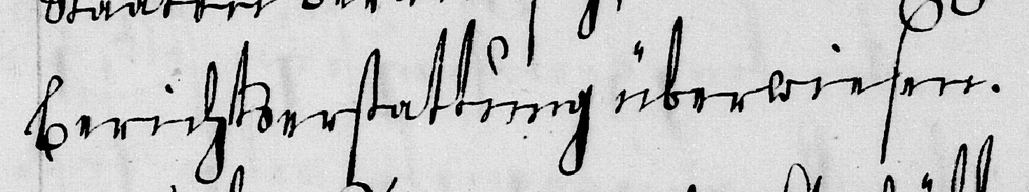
Berichterstattung überwiesen.
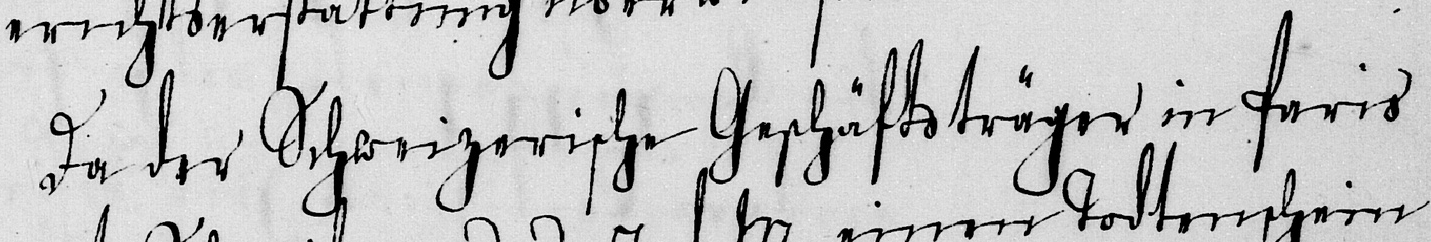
Da der Schweizerische Geschäftsträger in Paris
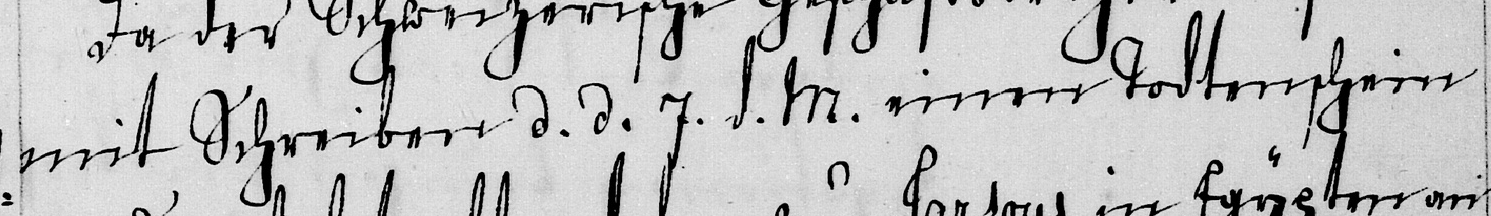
mit Schreiben d. d. 7. d. M. einen Todtenschein
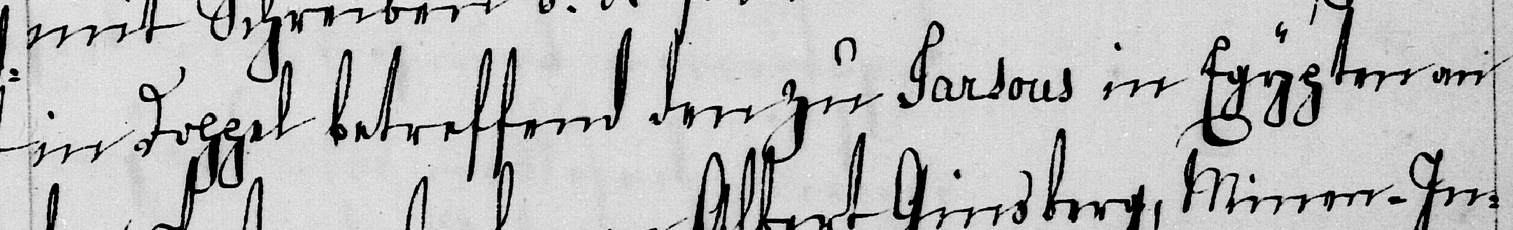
in Doppel betreffend den zu Tarsous in Egypten an
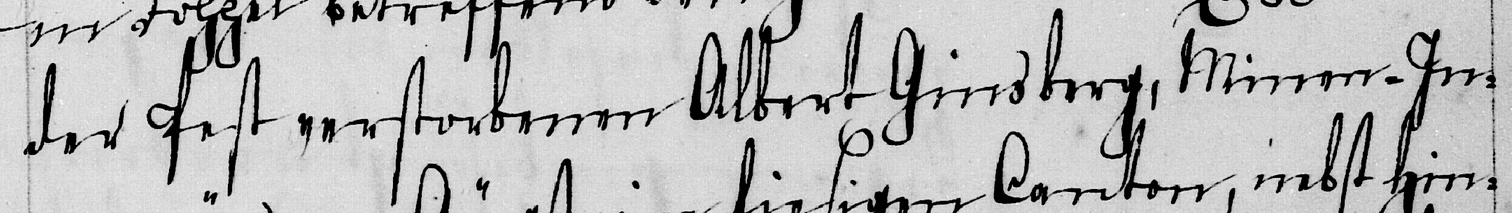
der Pest verstorbenen Albert Ginsberg, Minen-In¬
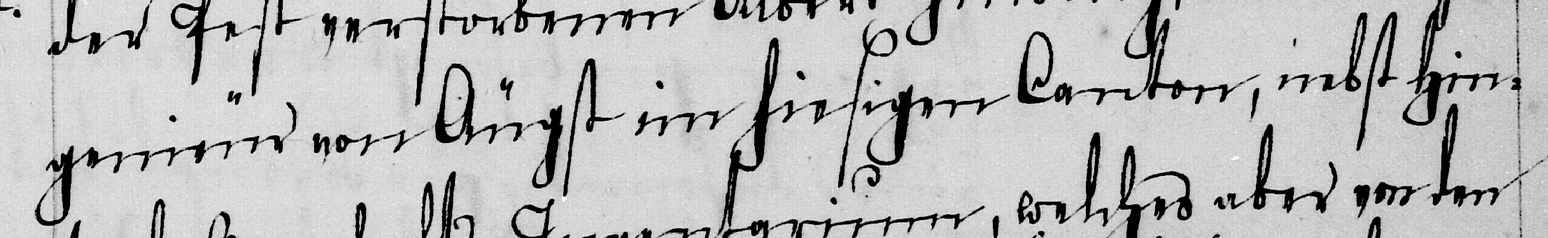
genieur von Äugst im hiesigen Canton, nebst Hin¬
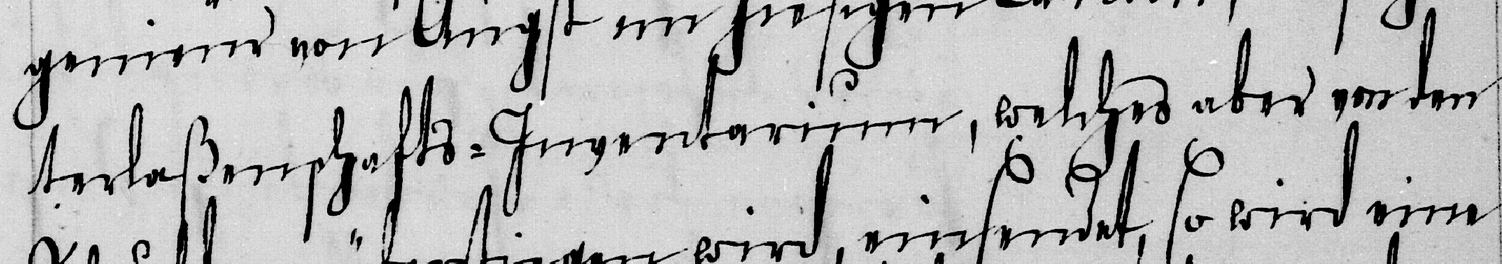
terlaßenschafts-Inventarium, welches aber von den
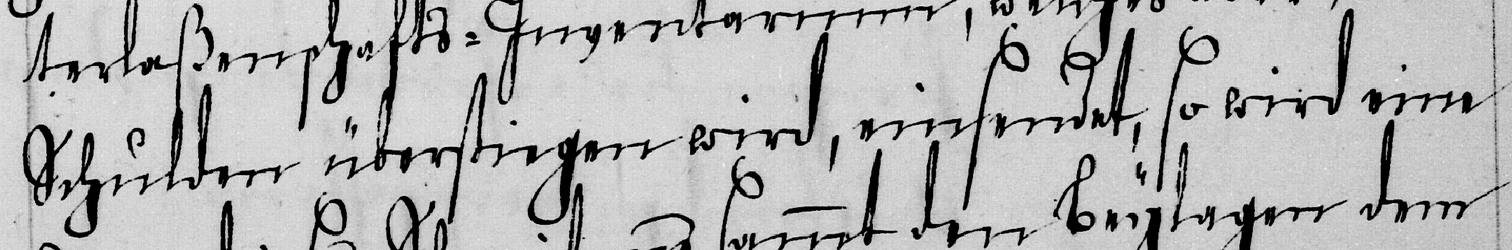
Schulden überstiegen wird, einsendet, so wird eine
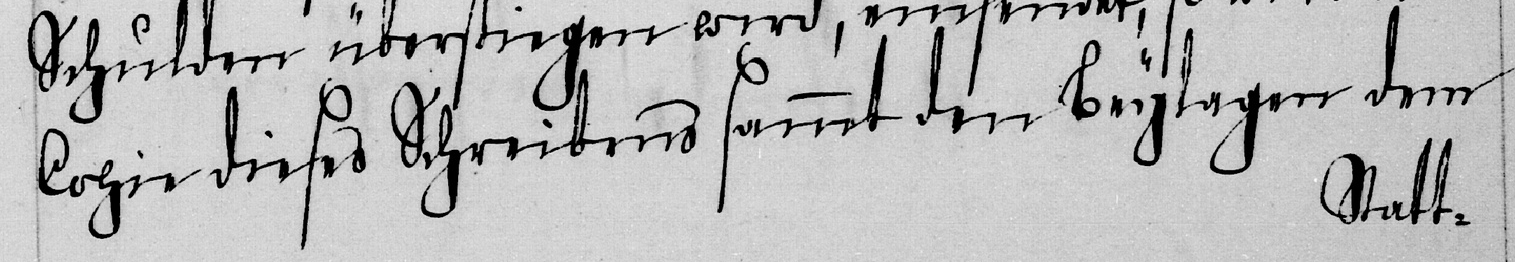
Copie dieses Schreibens sammt den Beylagen dem
